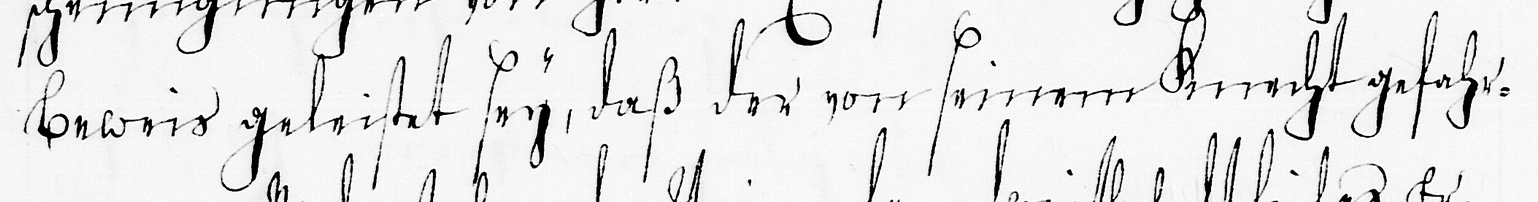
Beweis geleistet sey, daß der von seinem Knecht gefahr¬
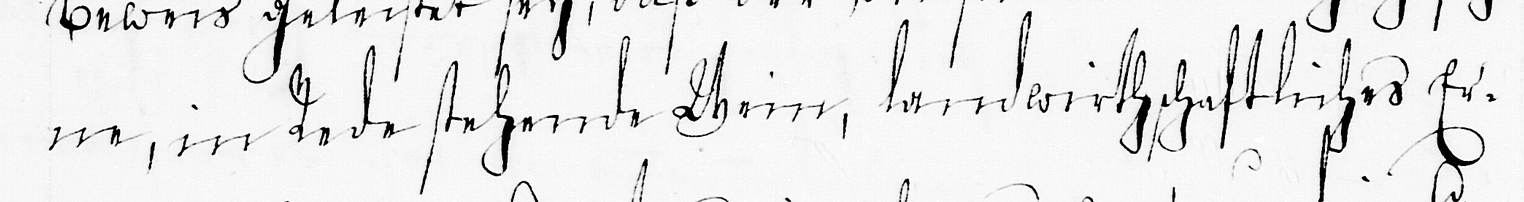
ne, in Rede stehende Wein, landwirthschaftliches E¬
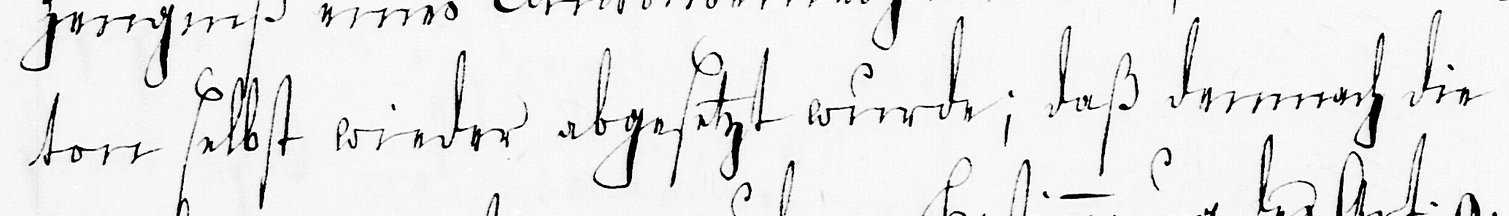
ton selbst wieder abgesetzt wurde; daß demnach die
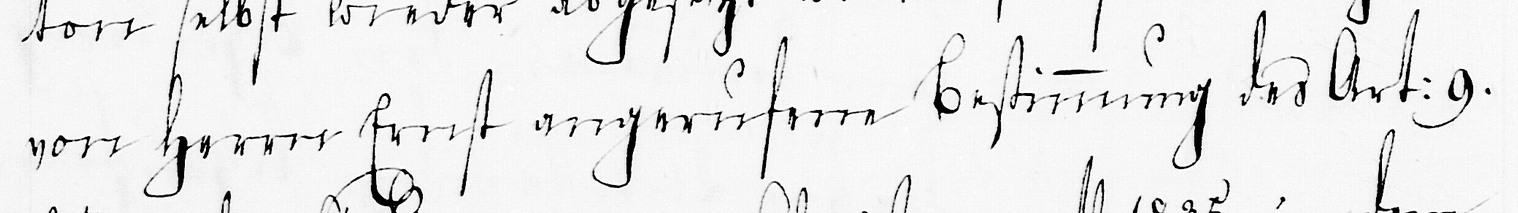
von Herrn Ernst angerufene Bestimmung des Art: 9.
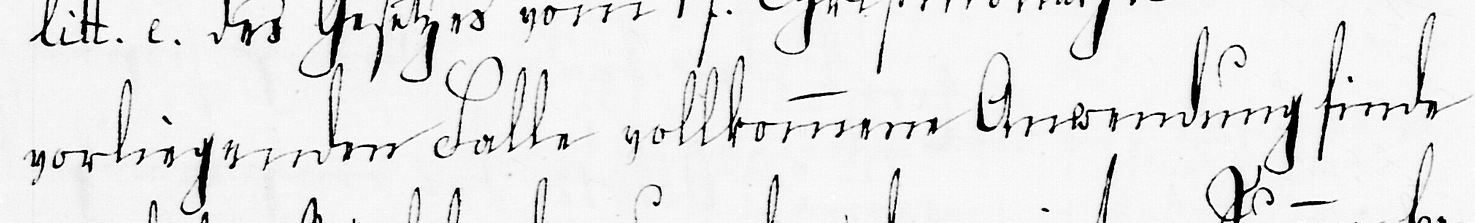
vorliegenden Falle vollkommene Anwendung finde
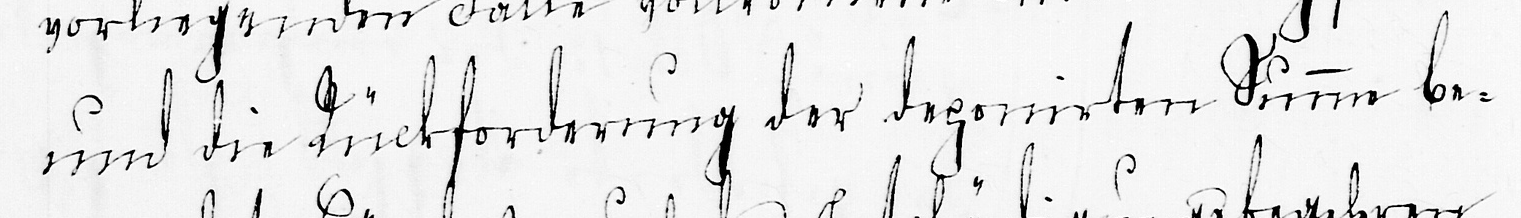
und die Rückforderung der deponirten Summe be¬
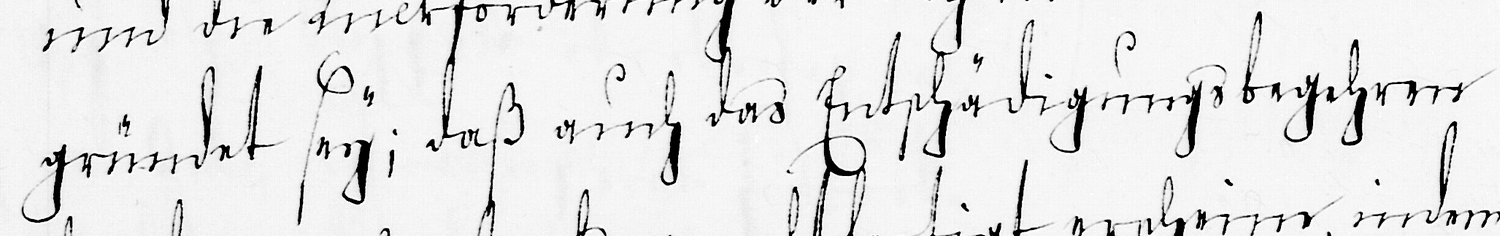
gründet sey; daß auch das Entschädigungsbegehren
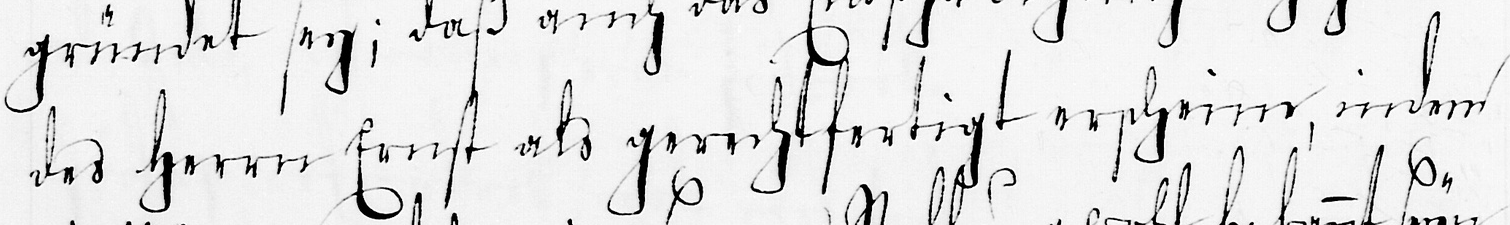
des Herrn Ernst als gerechtfertigt erscheine, indem
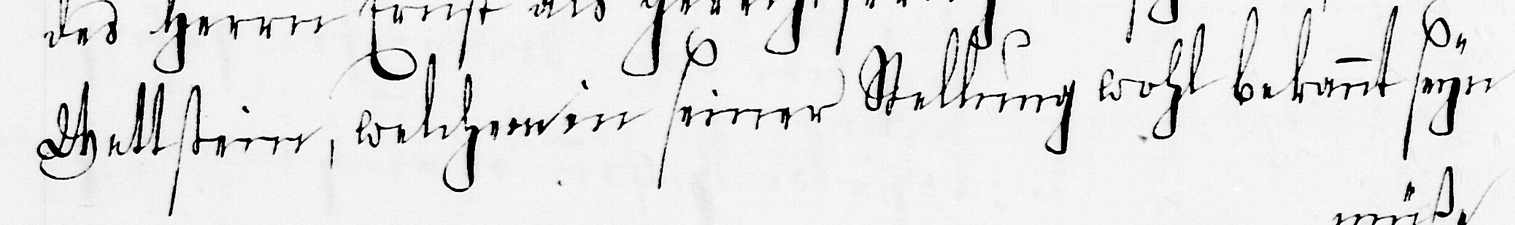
Wettstein, welchem in seiner Stellung wohl bekannt seyn
